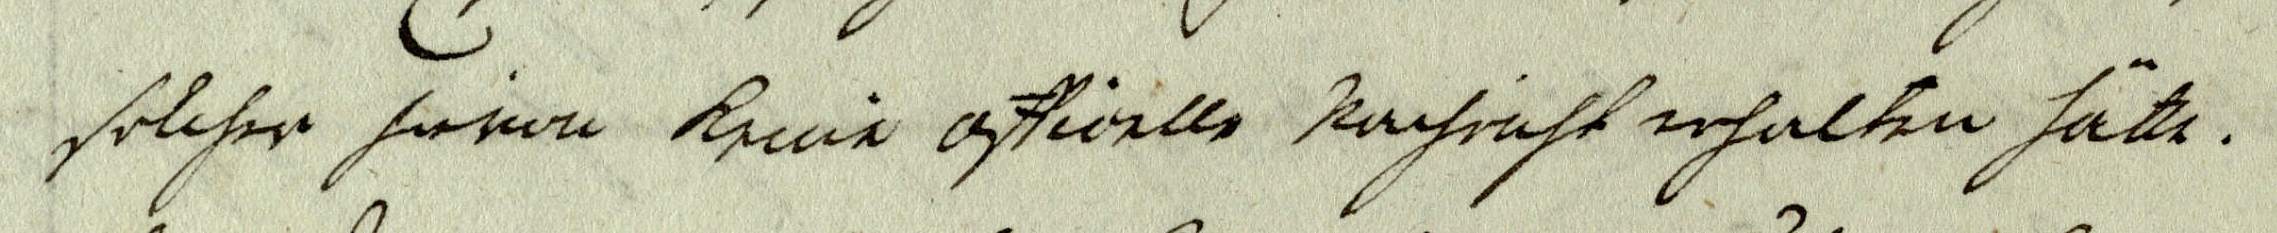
solcher hiervon keine officielle Nachricht erhalten hätte.
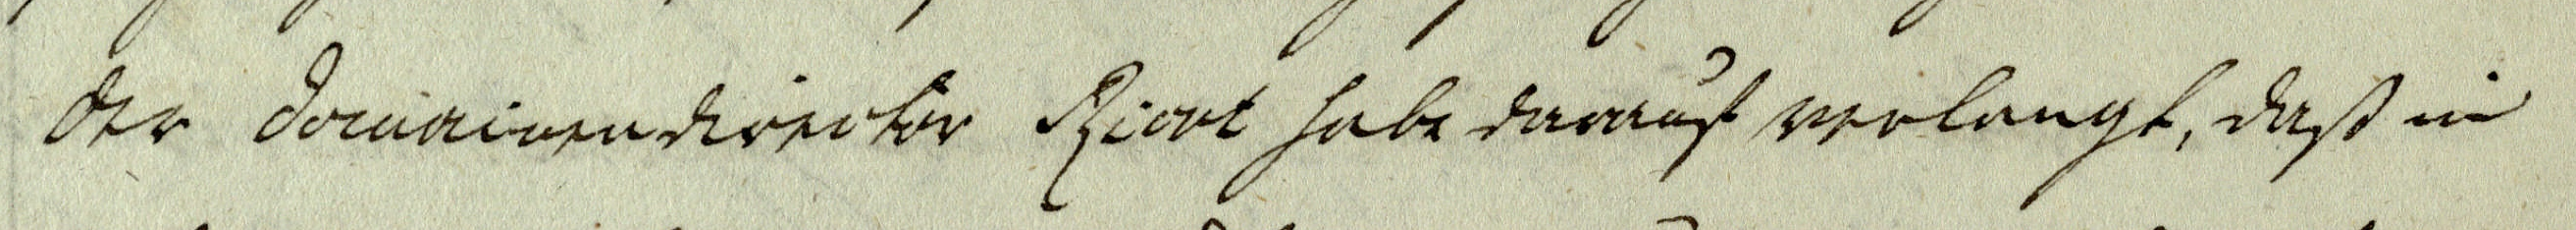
Der Domainendirector Ricot habe darauf verlangt, daß in
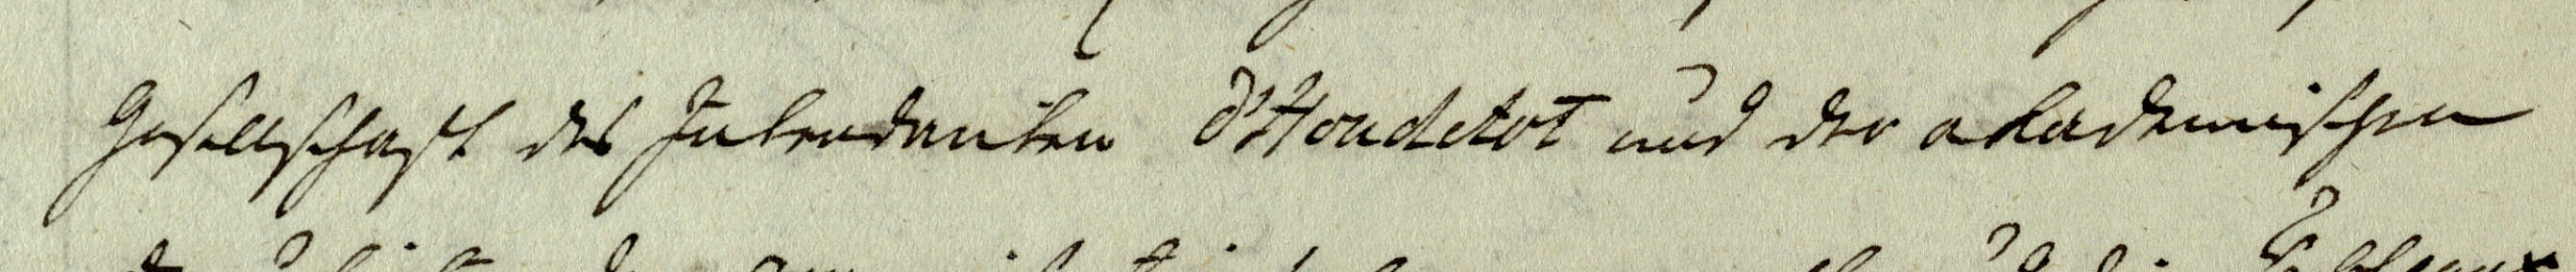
Gesellschaft des Intendanten d' Hondetot und der akademischen
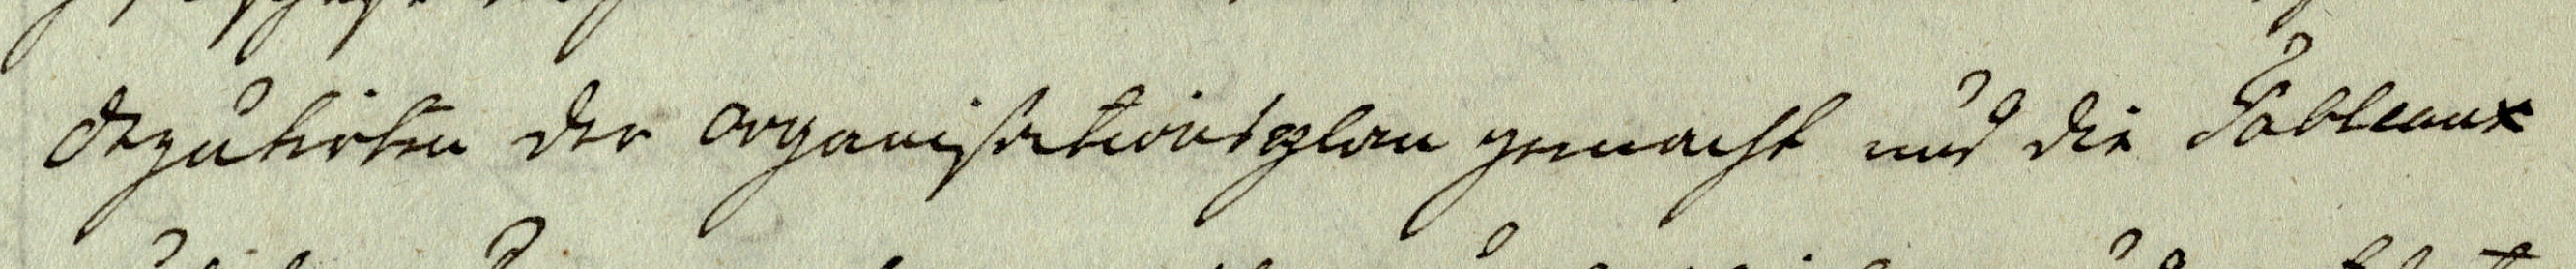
Deputirten der Organisationsplan gemacht und die Tableaux
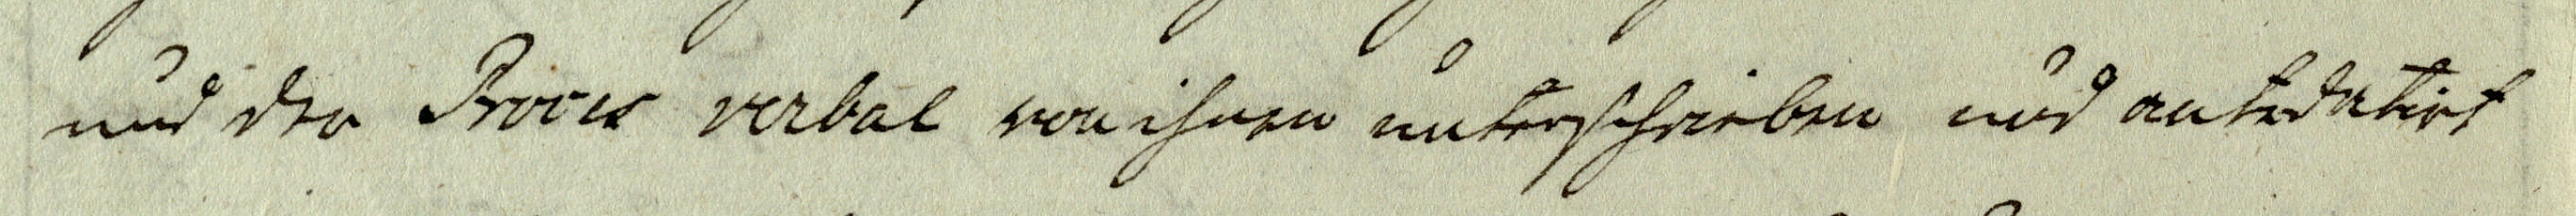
und der Proces verbal von ihnen unterschrieben und antedatirt
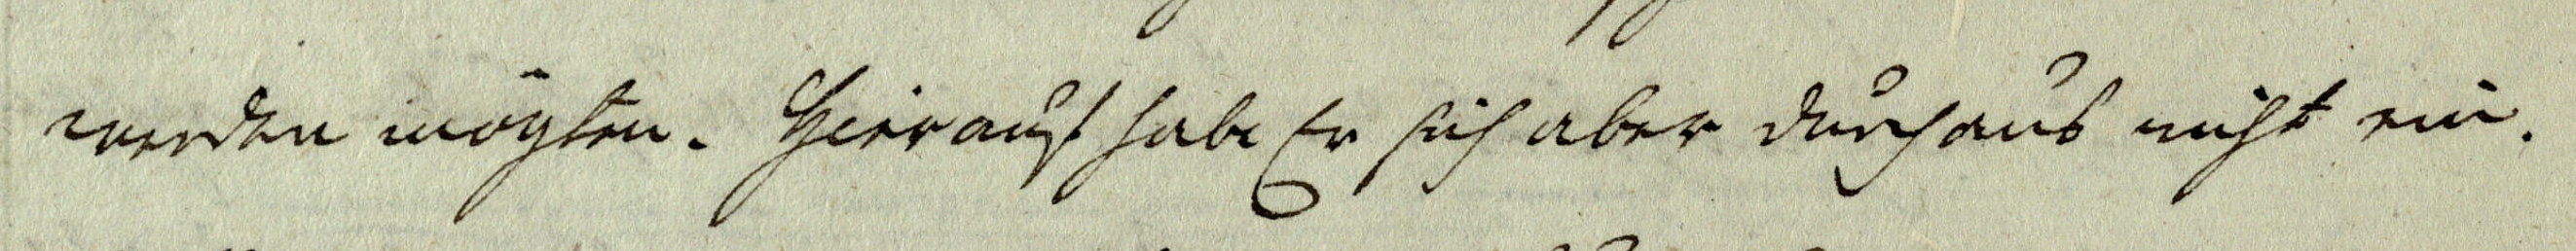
werden mögten. Hierauf habe Er sich aber durchaus nicht ein¬
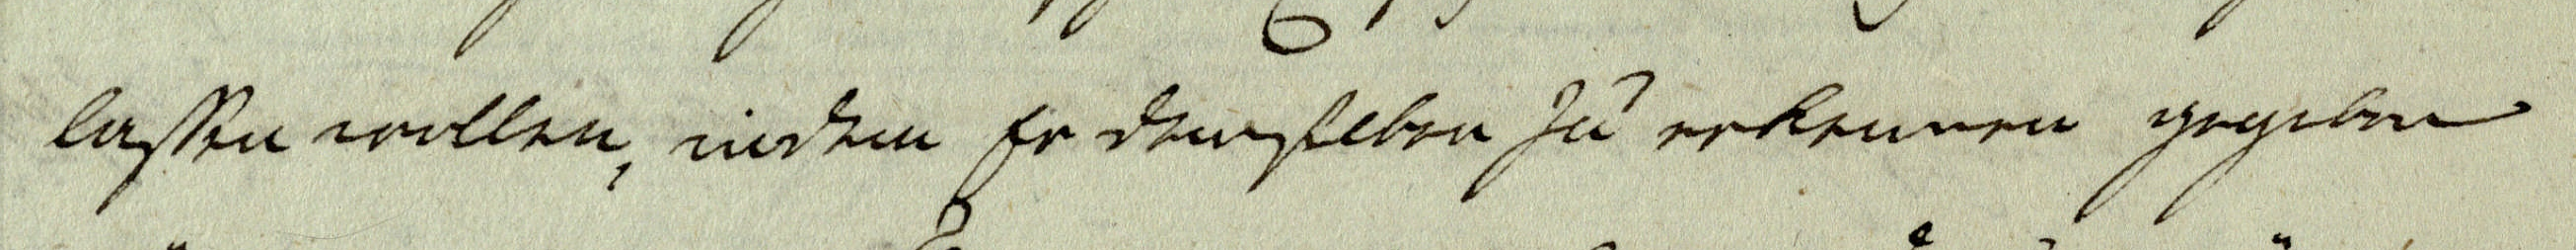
lassen wollen, indem Er demselben zu erkennen gegeben
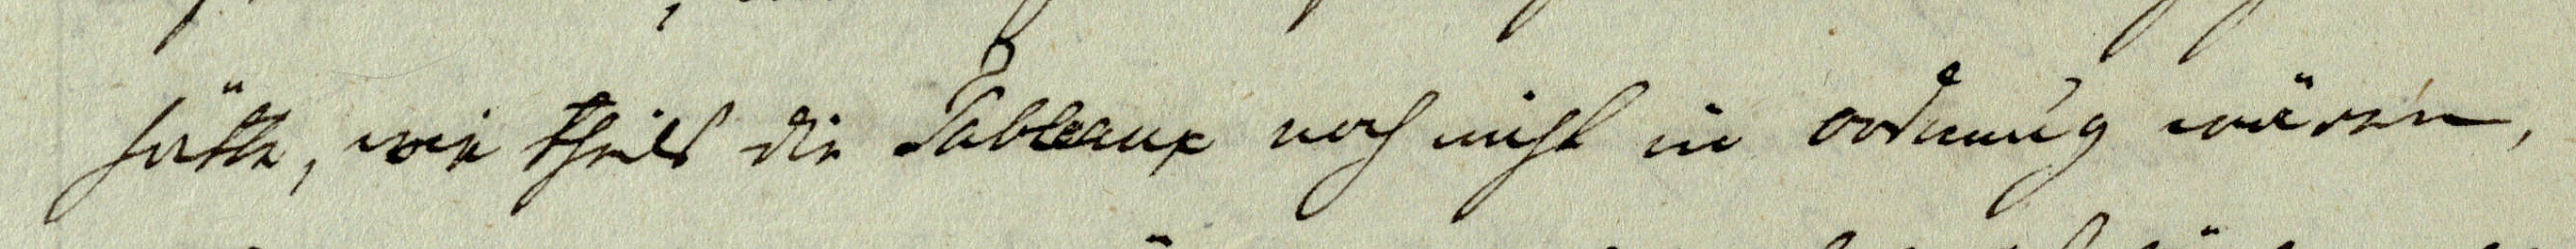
hätte, wie theils die Tableaux noch nicht in Ordnung wären,
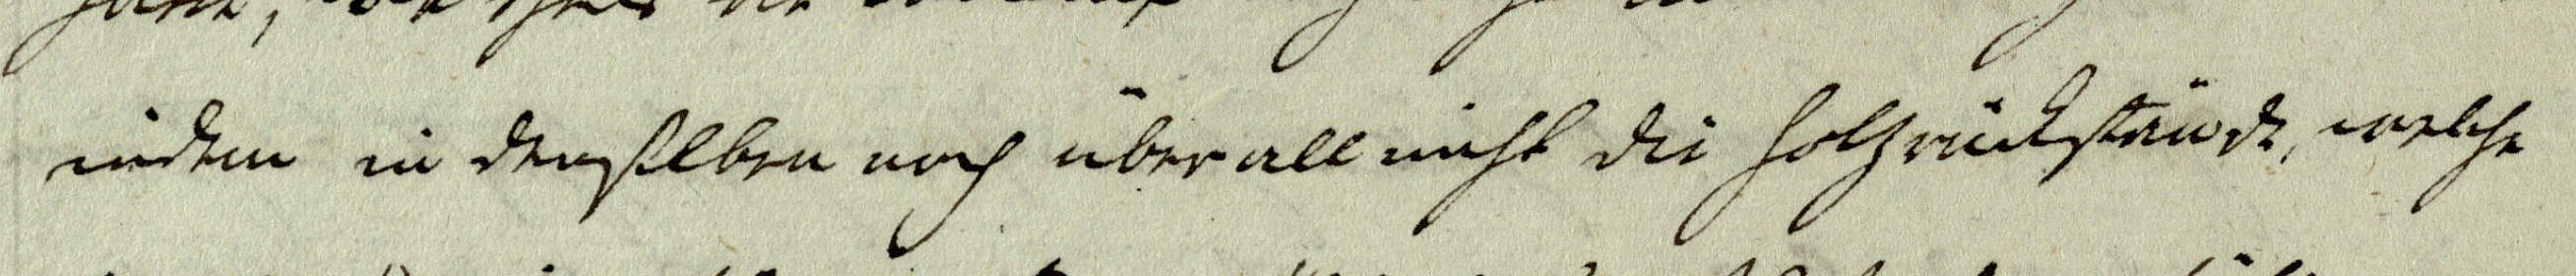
indem in denselben noch überall nicht die Holzrückstände, welche
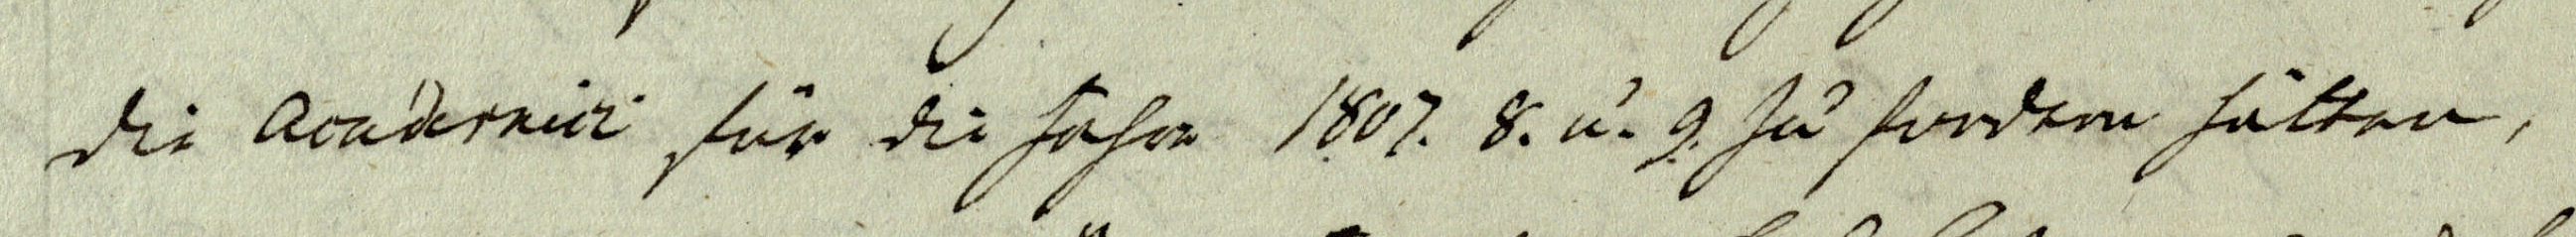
die Academici für die Jahre 1807. 8. u. 9. zu fordern hätten,
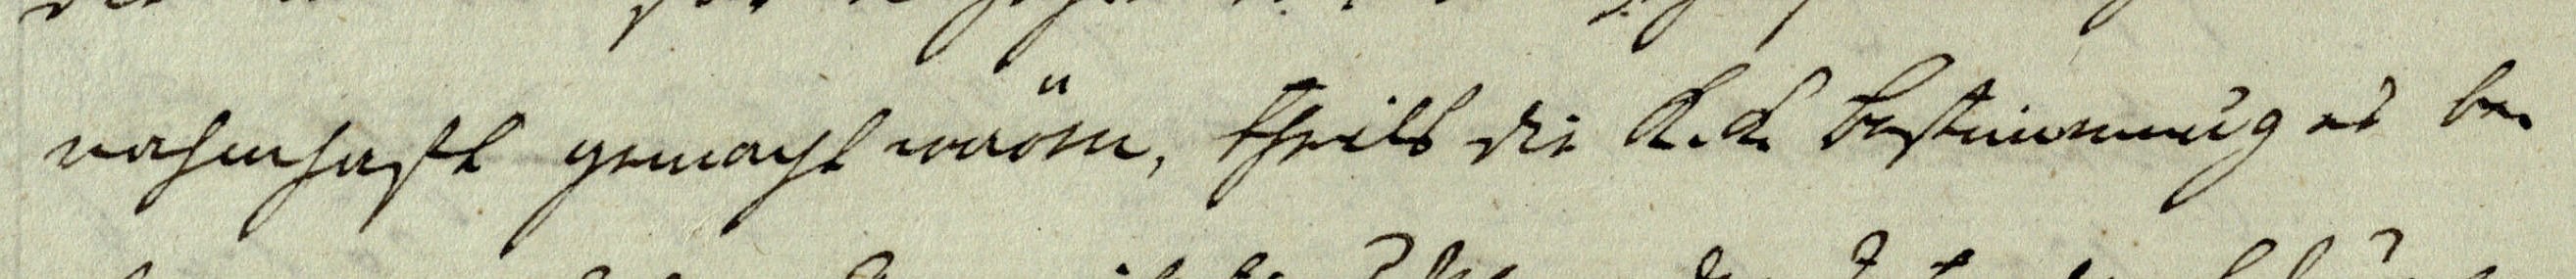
nahmhaft gemacht wären, theils die K. K. Bestimmung es be¬
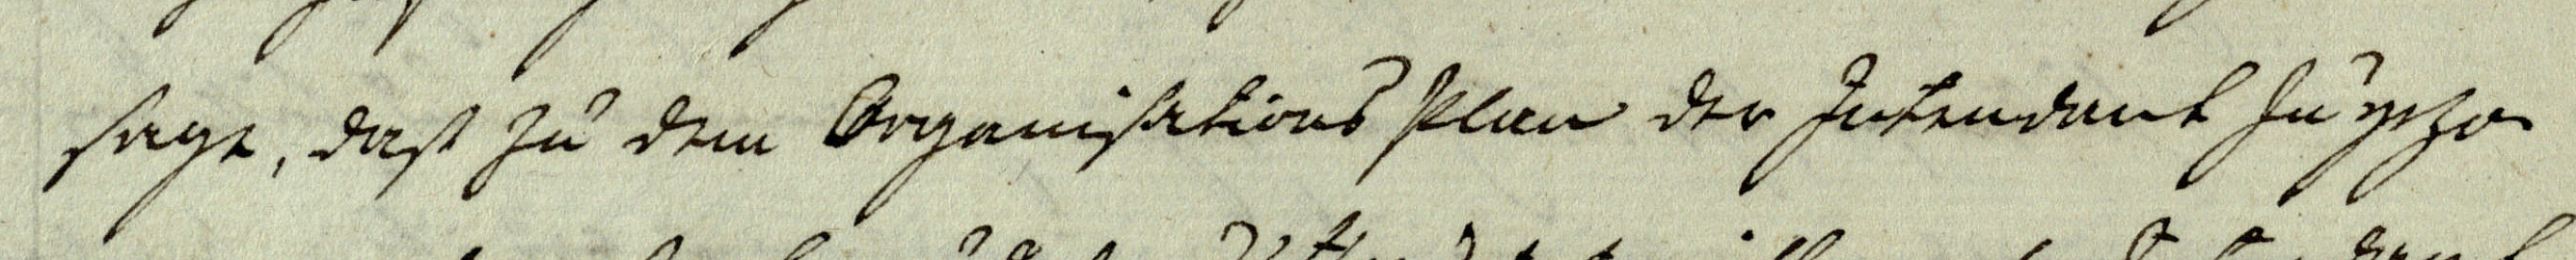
sage, daß zu dem Organisations Plan der Intendant zu gezo¬
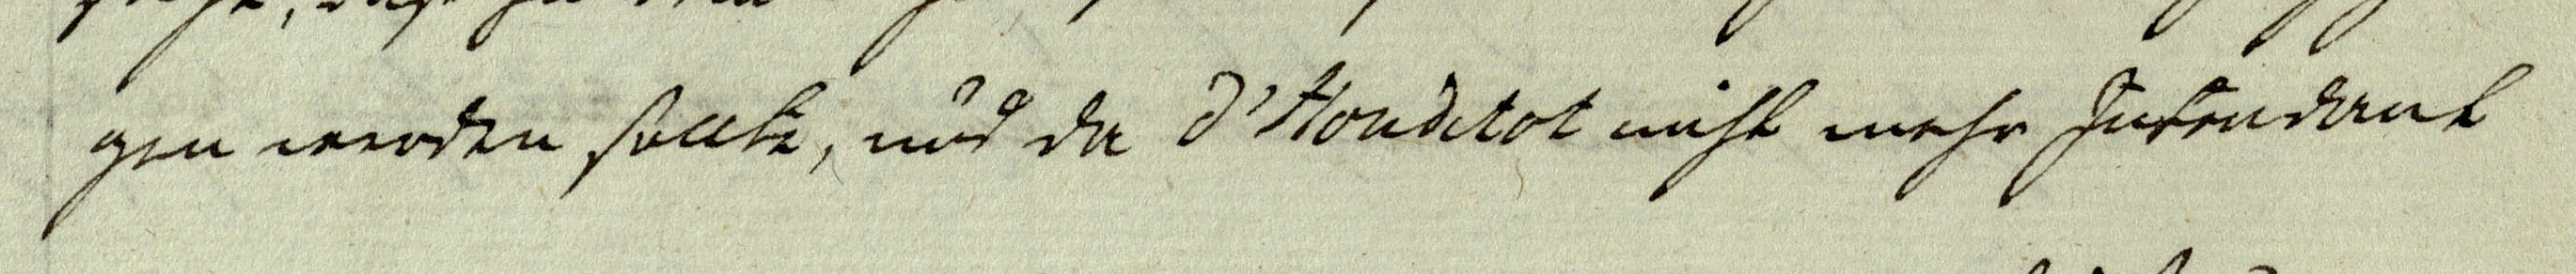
gen werden sollte, und da d' Hondetot nicht mehr Intendant
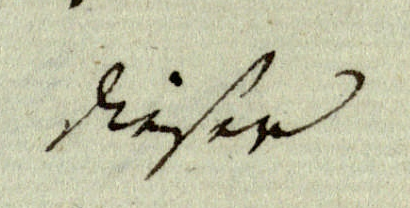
dieser
